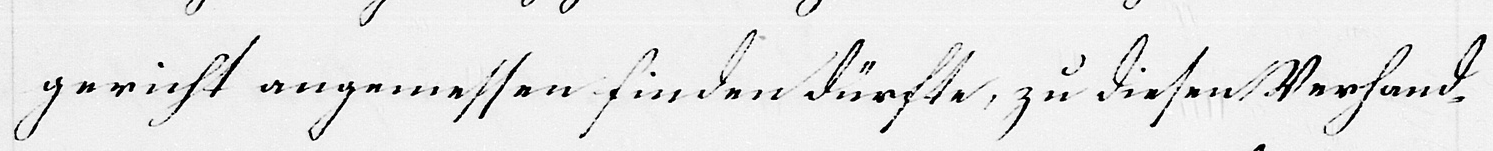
gericht angemessen finden dürfte, zu diesen Verhand¬
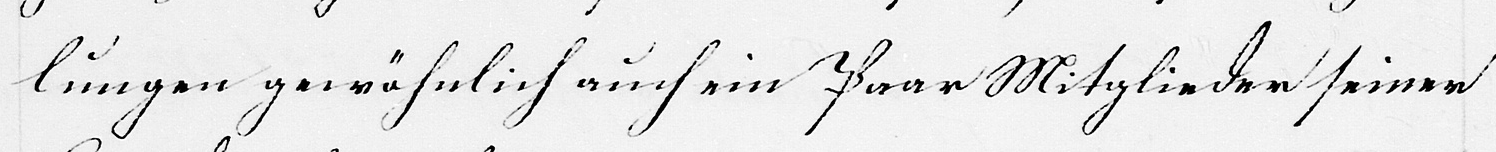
lungen gewöhnlich auch ein Paar Mitglieder seiner
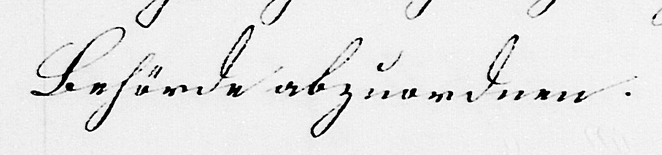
Behörde abzuordnen.
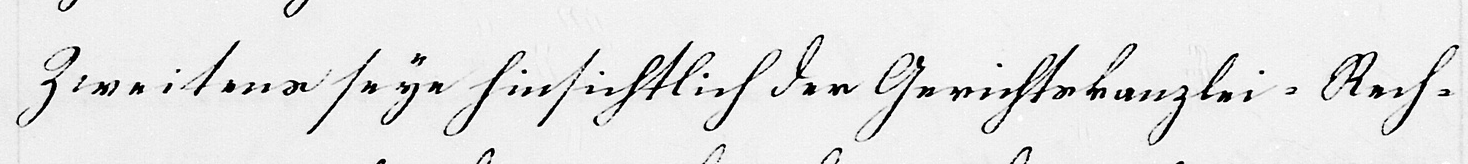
Zweitens seye hinsichtlich der Gerichtskanzlei-Rech¬
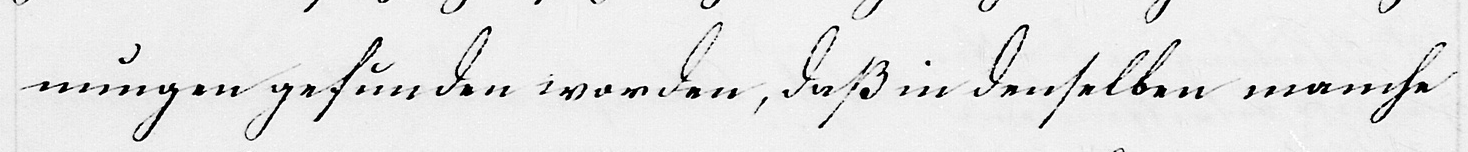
nungen gefunden worden, daß in denselben manche
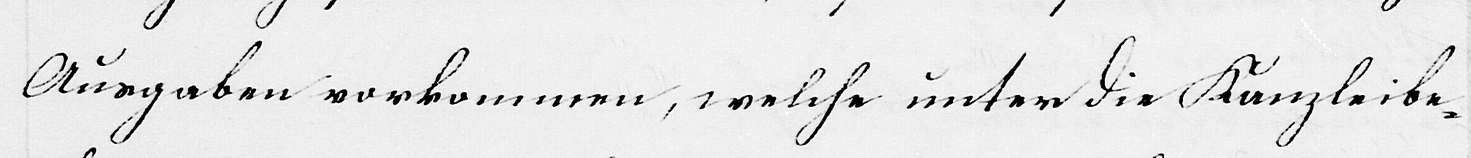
Ausgaben vorkommen, welche unter die Kanzleibe¬
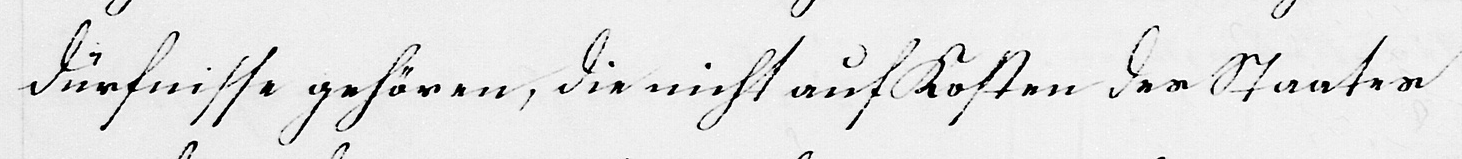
dürfnisse gehören, die nicht auf Kosten des Staates
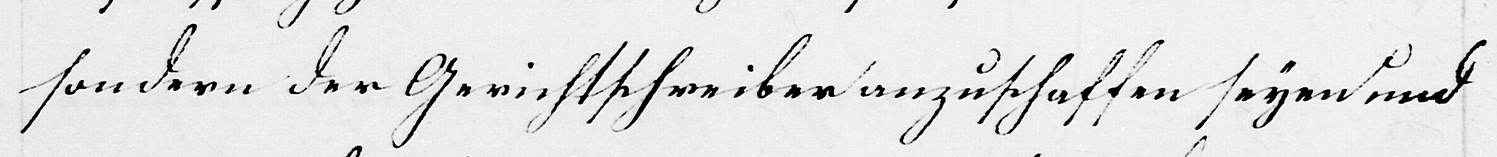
sondern des Gerichtsschreiber anzuschaffen seyen und
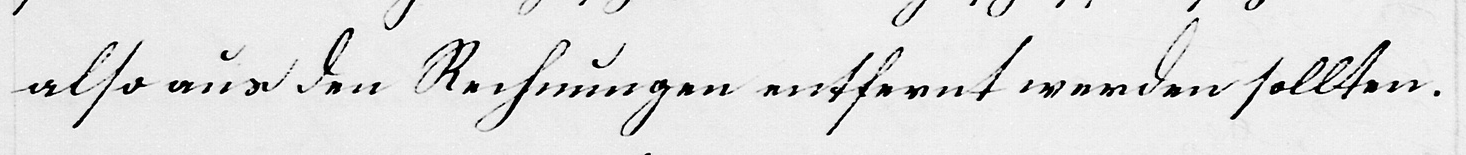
also aus den Rechnungen entfernt werden sollten.
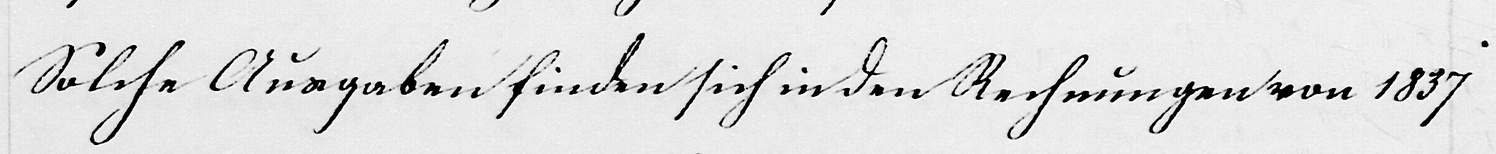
Solche Ausgaben finden sich in den Rechnungen von 1837
